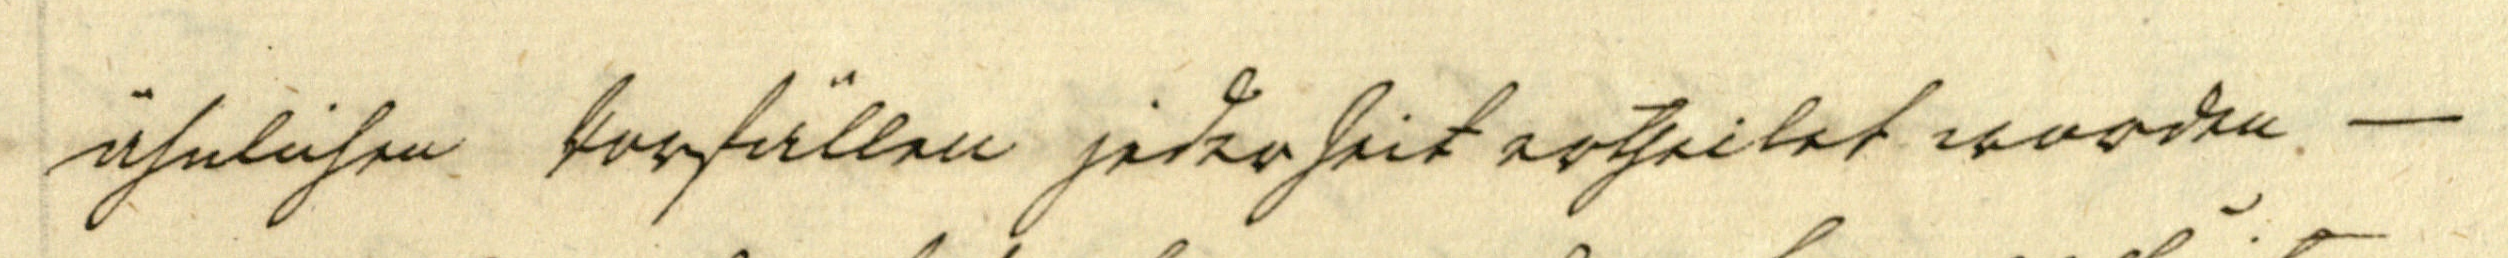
ähnlichen Vorfällen jeder Zeit ertheilet worden.
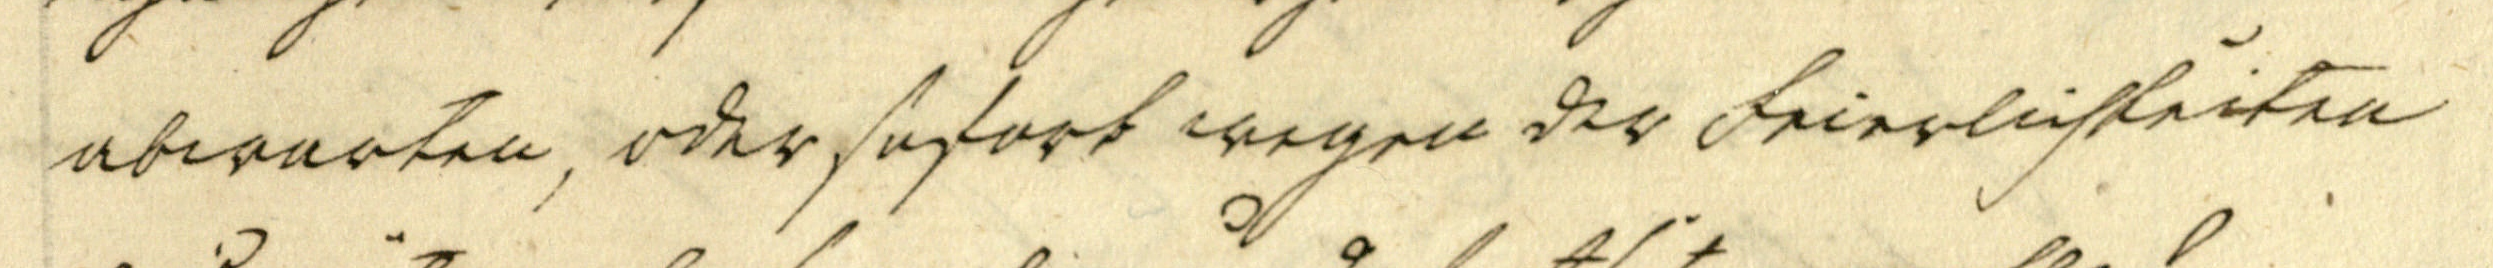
abwarten, oder sofort wegen der Feierlichkeiten
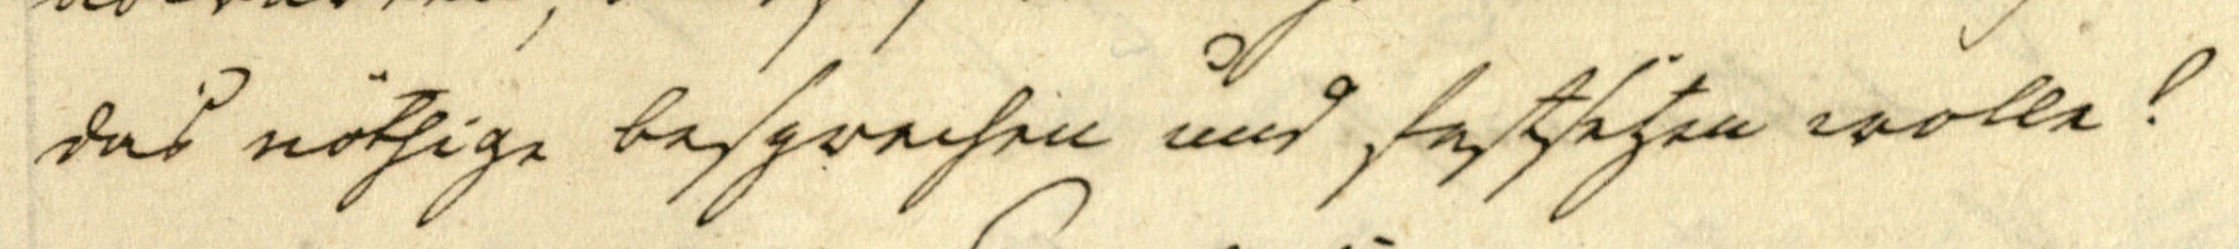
das nöthige besprechen und festsetzen wolle?
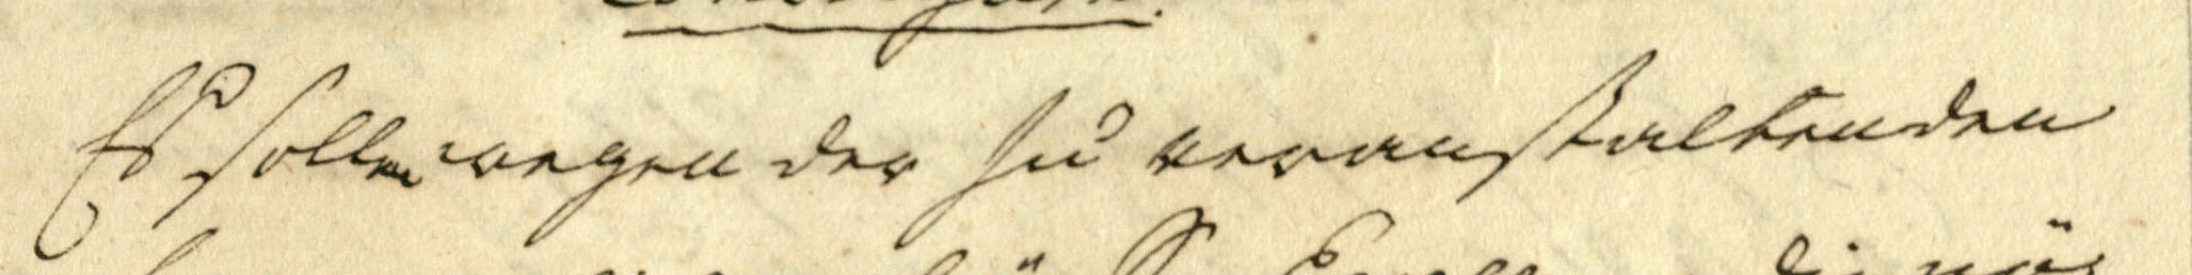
Es sollen wegen der zu veranstaltenden
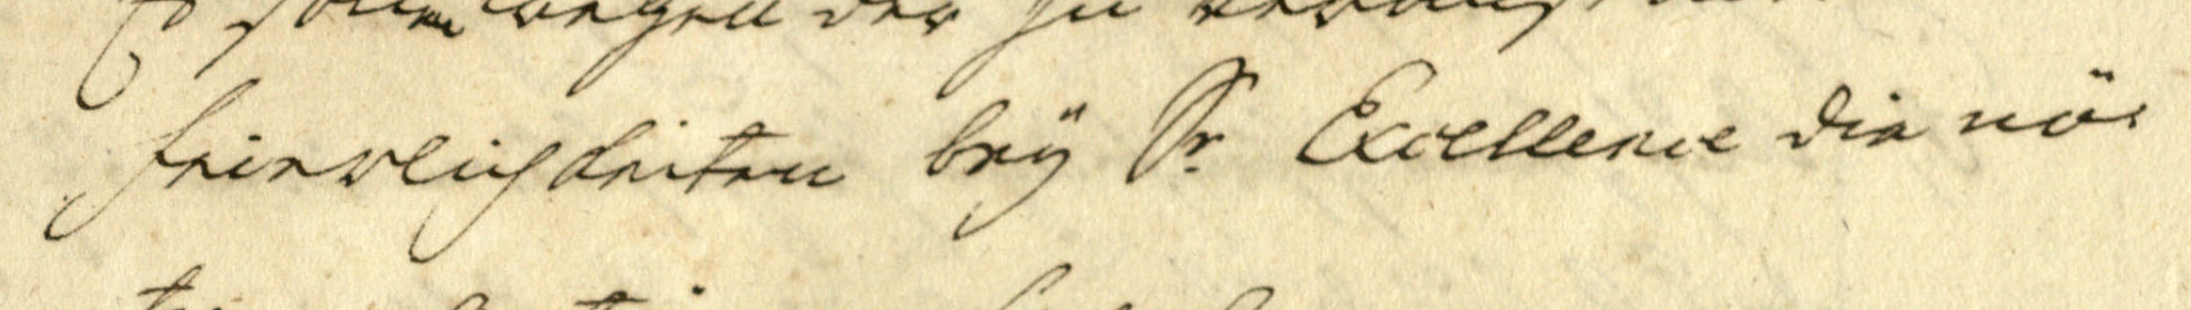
Feierlichkeiten beÿ Sr Excellence die nö¬
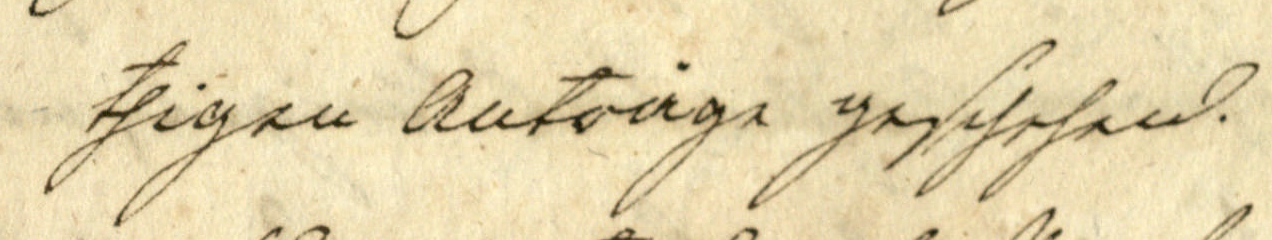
thigen Anträge geschehen.
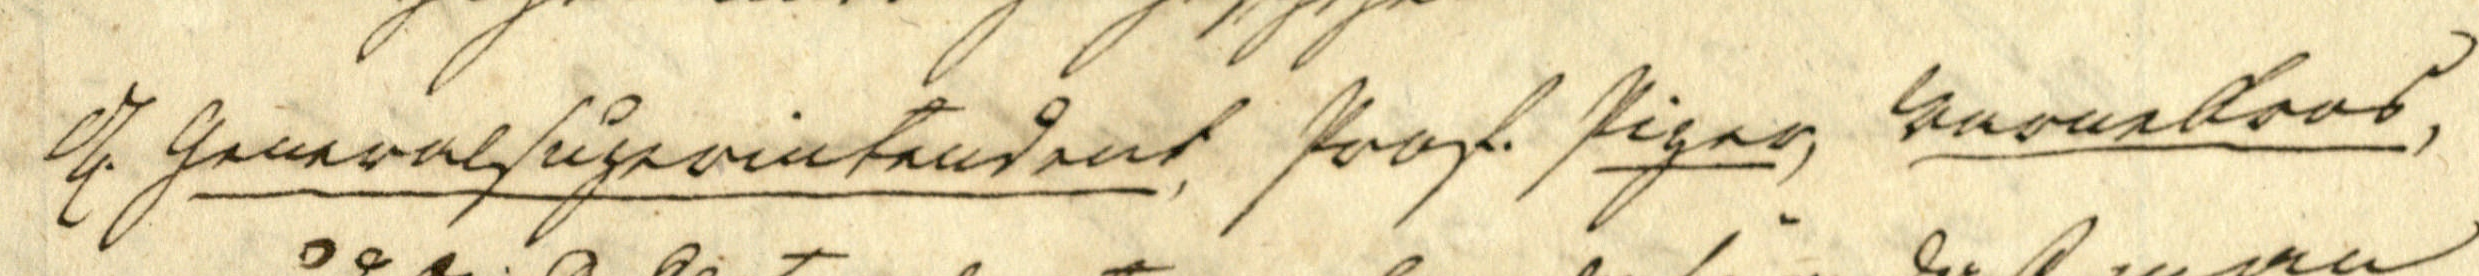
dh. Generalsuperintendent Prof. Piper, Warnekros,
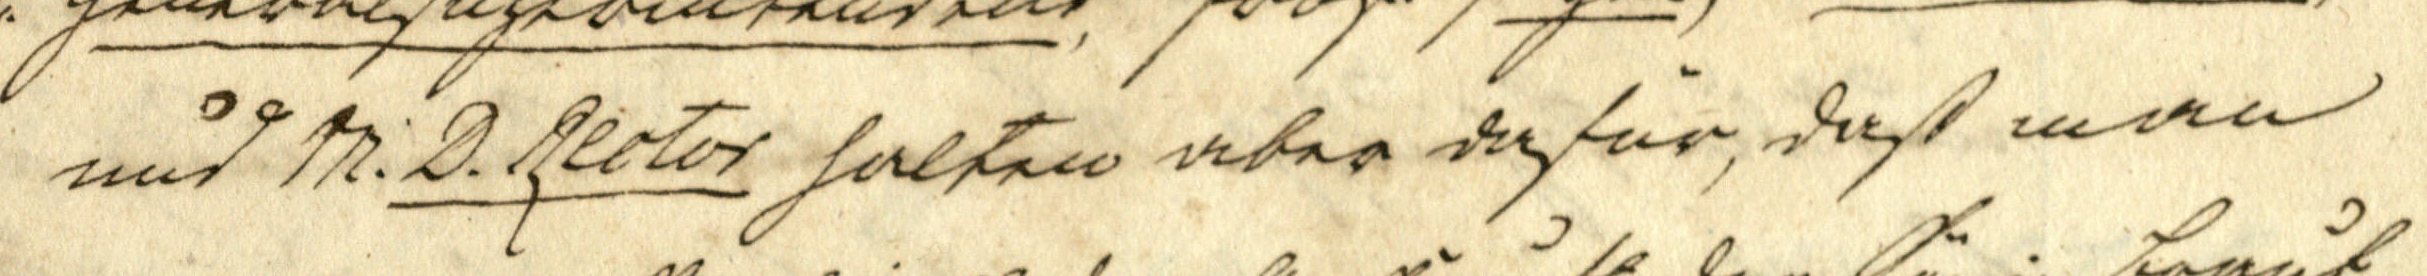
und M. D. Rector halten aber dafür, daß man
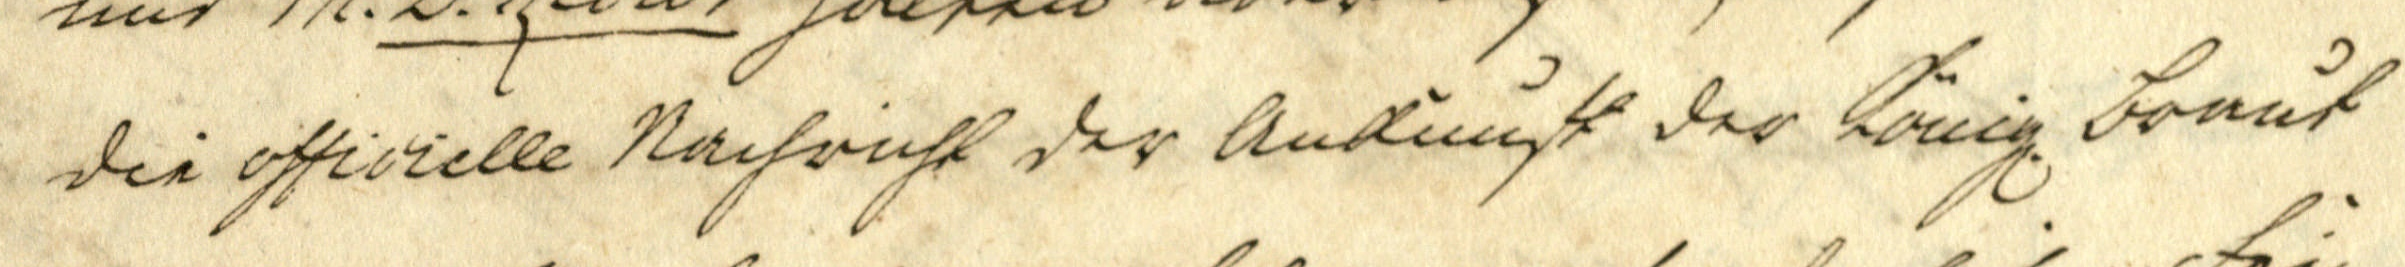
die officielle Nachricht der Ankunft der Königl. Braut
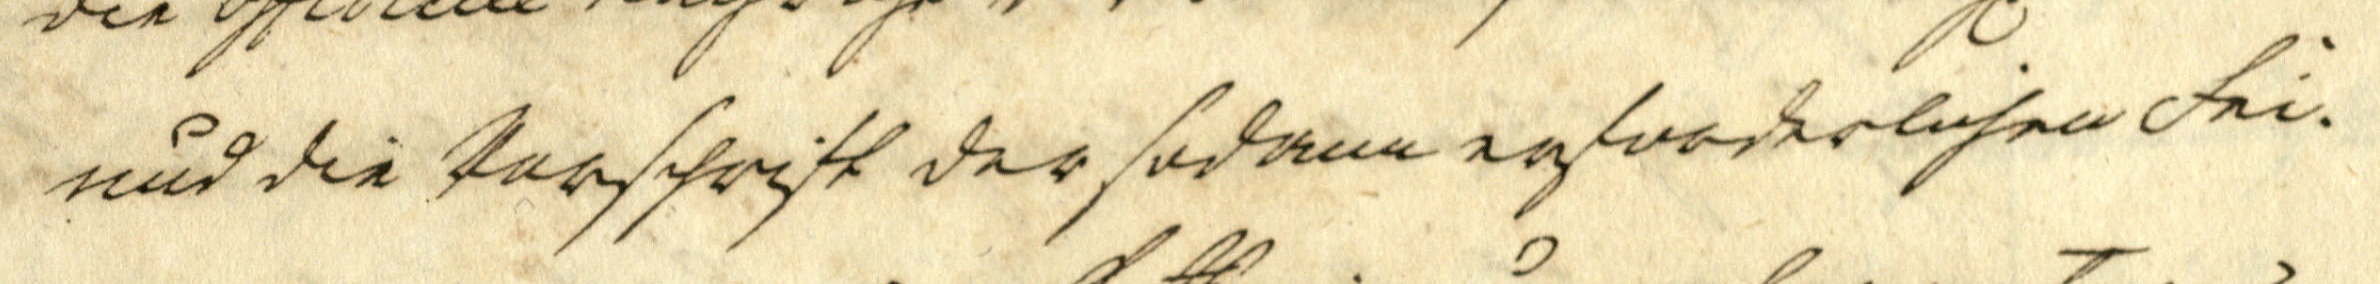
und die Vorschrift der sodann erforderlichen Fei¬
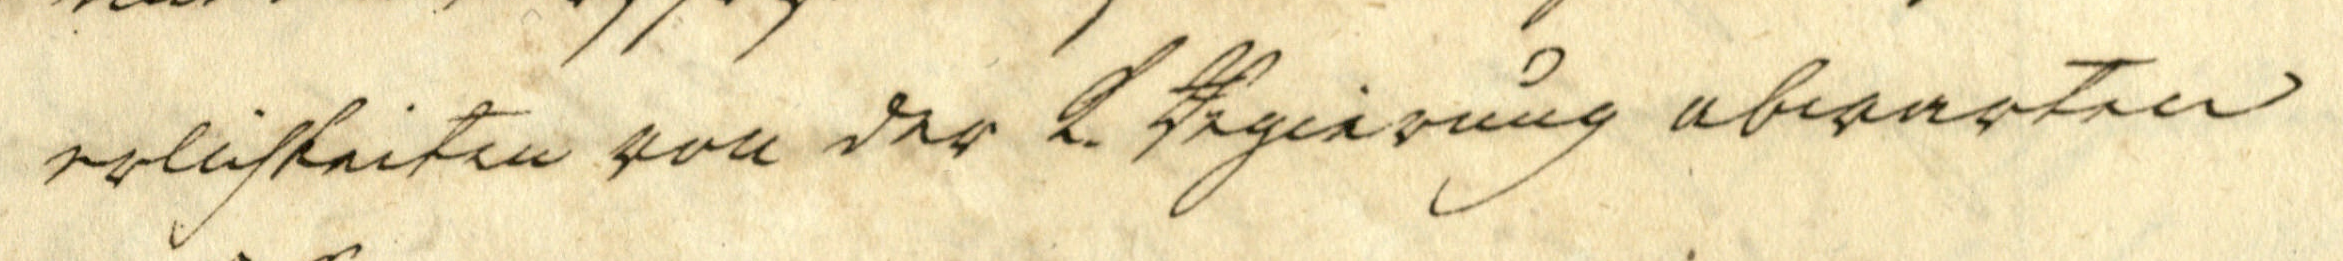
erlichkeiten von der K. Regierung abwarten
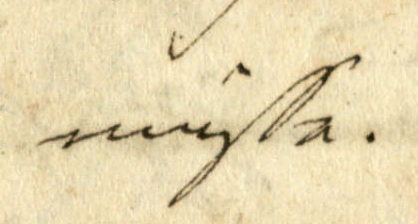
müsse.
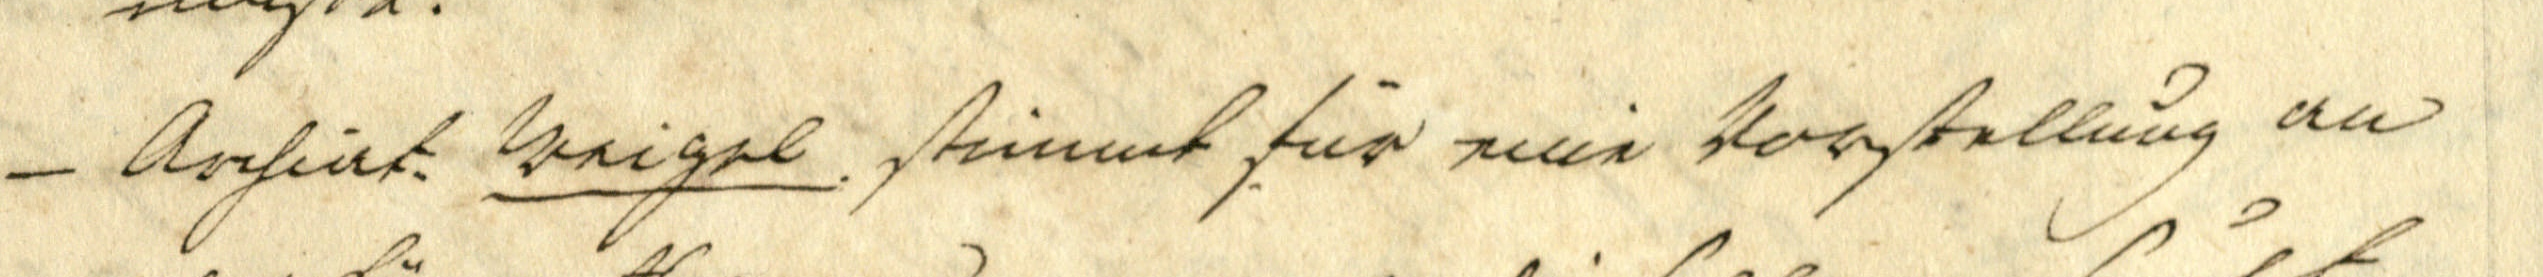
Archiat. Weigel stimmt für eine Vorstellung an
